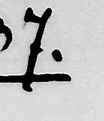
f.)
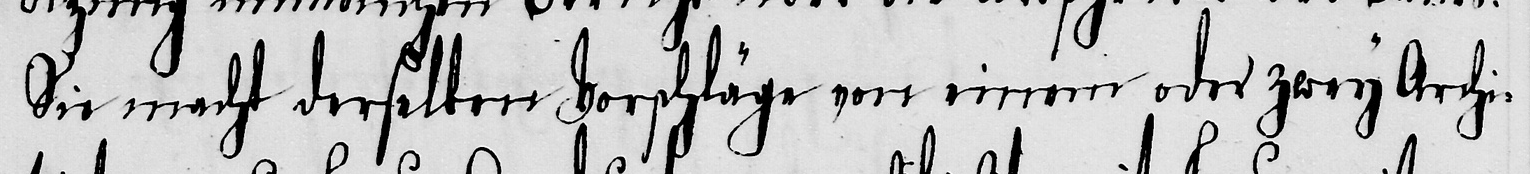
Sie macht derselben Vorschläge von einem oder zwey Archi¬
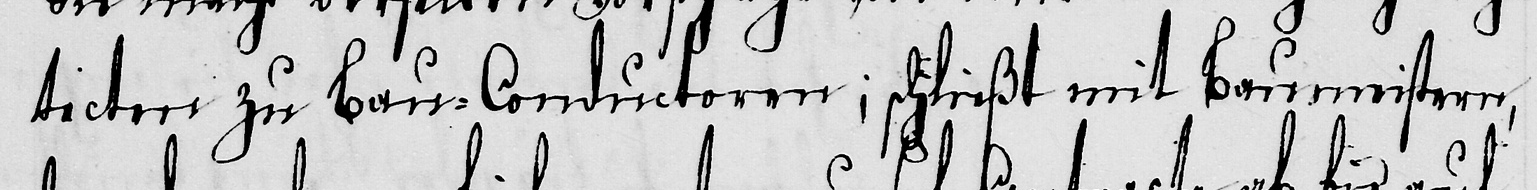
tecten zu Bau-Conductoren; schließt mit Baumeistern,
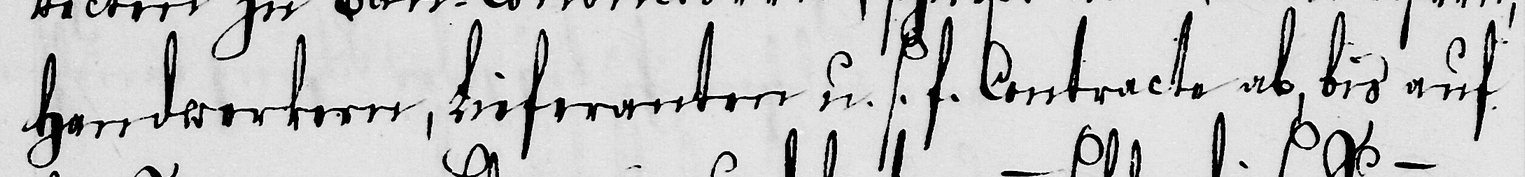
Handwerkern, Lieferanten u. s. f. Contracte ab, bis auf
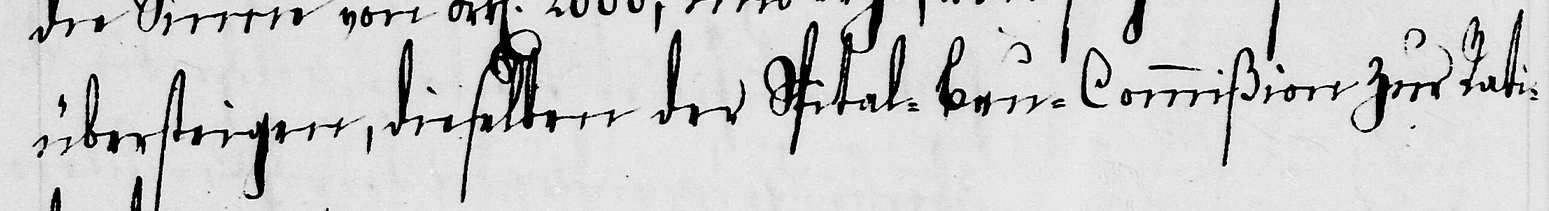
übersteigen, dieselben der Spital-Bau-Commißion zur Rat¬
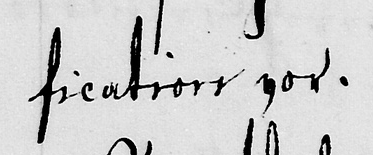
ification vor.
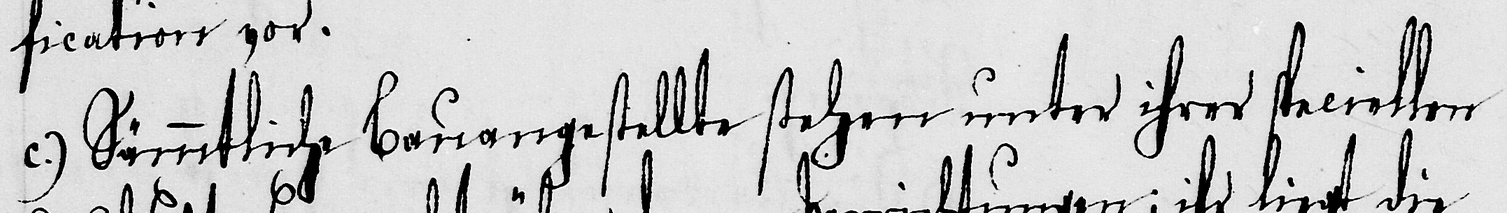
c.) Sämmtliche Bauangestellte stehen unter ihrer speciellen
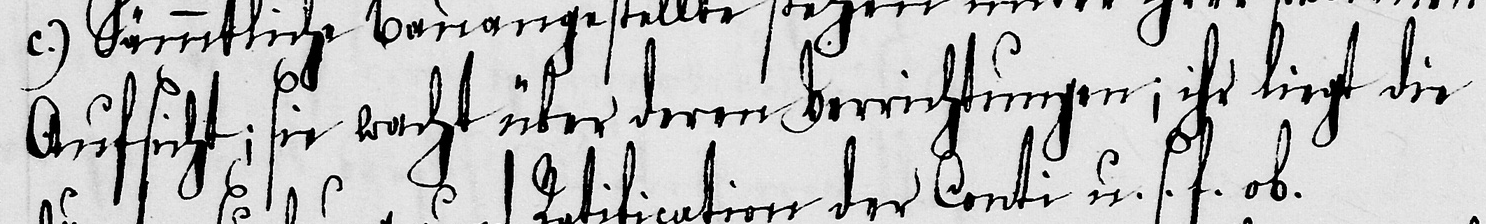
Aufsicht; sie wacht über deren Verrichtungen; ihr liegt die
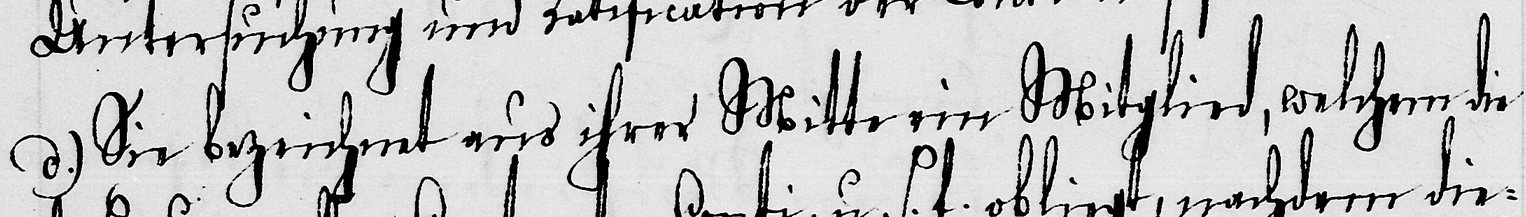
d.) Sie bezeichnet aus ihrer Mitte ein Mitglied, welchem die
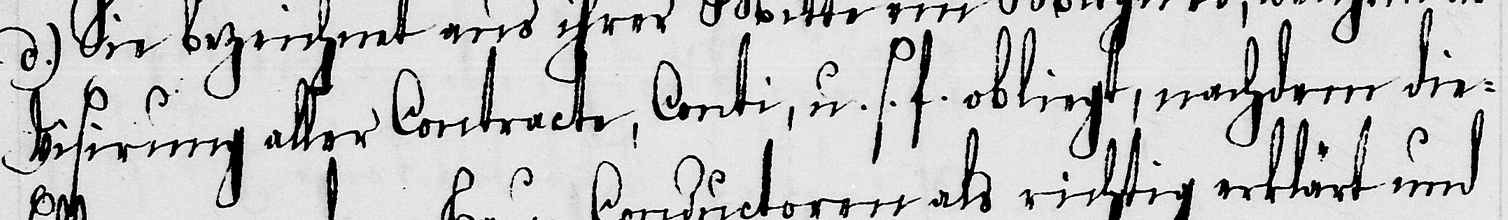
Visirung aller Contracte, Conti, u. s. f. obliegt, nachdem die¬
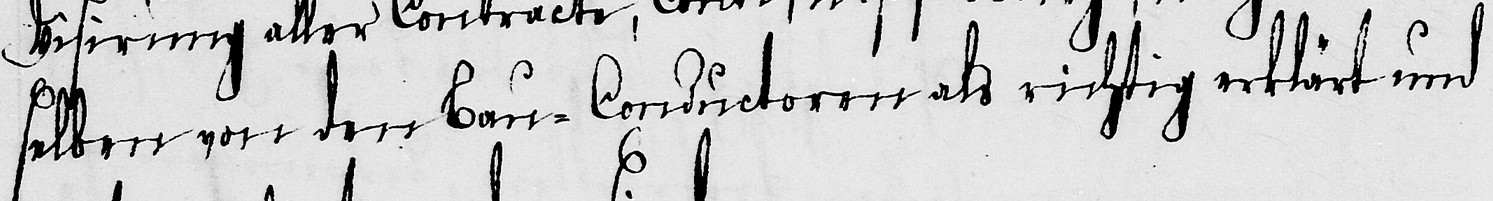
selben von den Bau-Conductoren als richtig erklärt und
